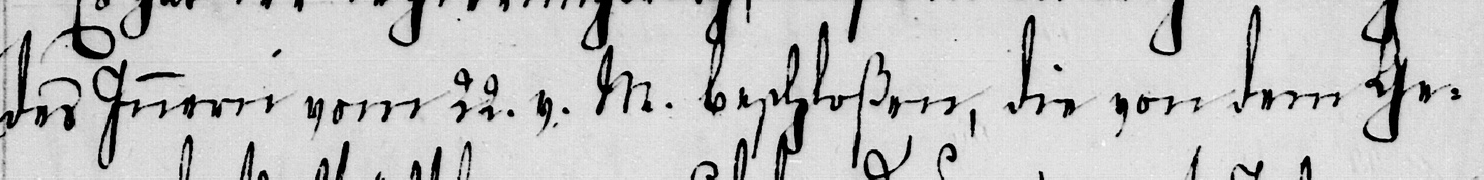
des Innern vom 22. v. M. beschloßen, die von dem Ge¬
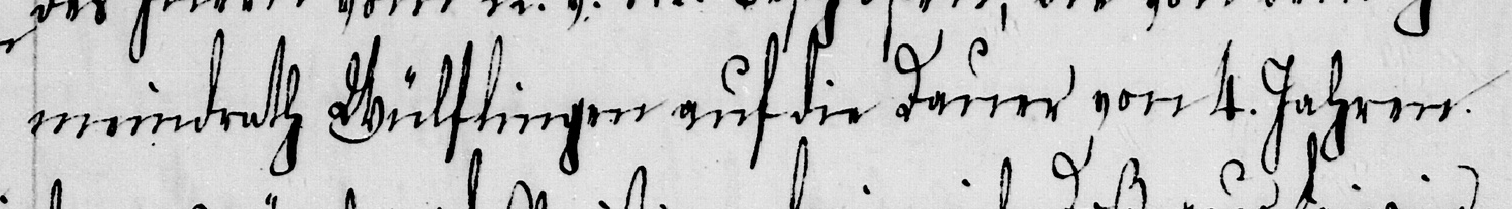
meindrath Wülflingen auf die Dauer von 4. Jahren
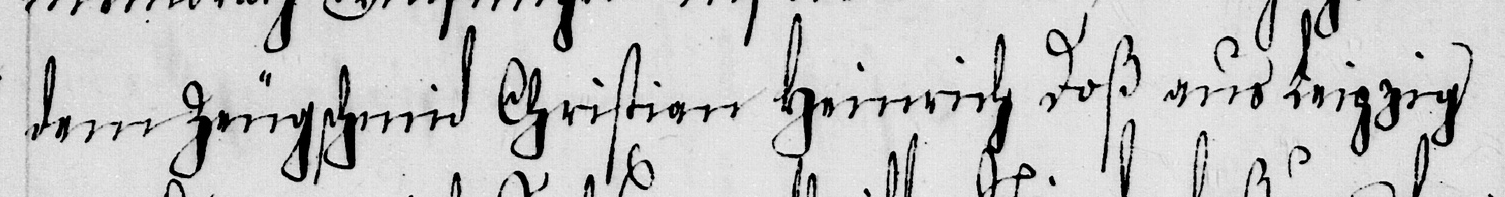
dem Zeugschmid Christian Heinrich Doß aus Leipzig
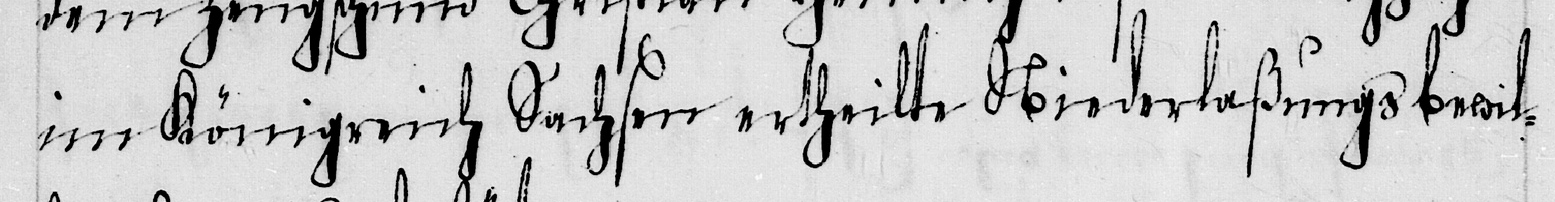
im Königreich Sachsen ertheilte Niederlaßungsbewil¬
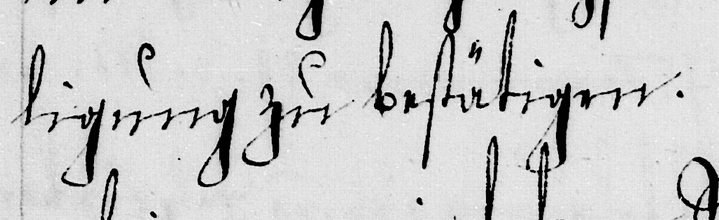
ligung zu bestätigen.
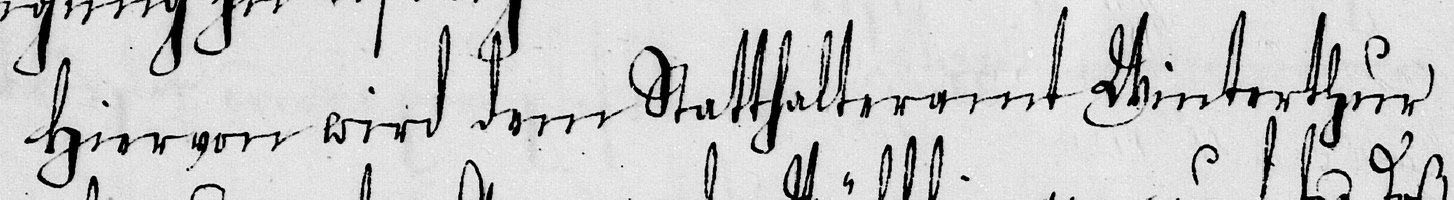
Hiervon wird dem Statthalteramt Winterthur
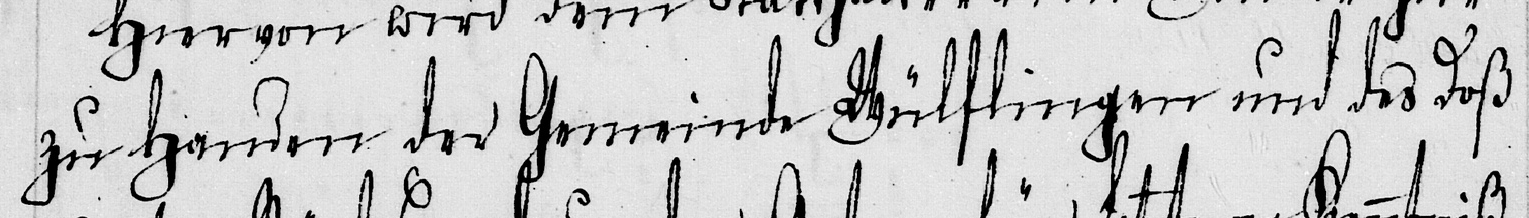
zu Handen der Gemeinde Wülflingen und des Doß
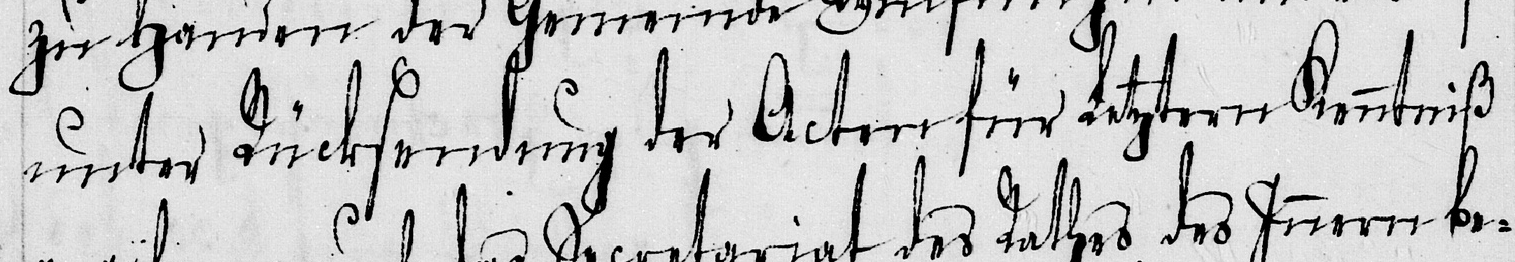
unter Rücksendung der Acten für Letztern Kenntniß
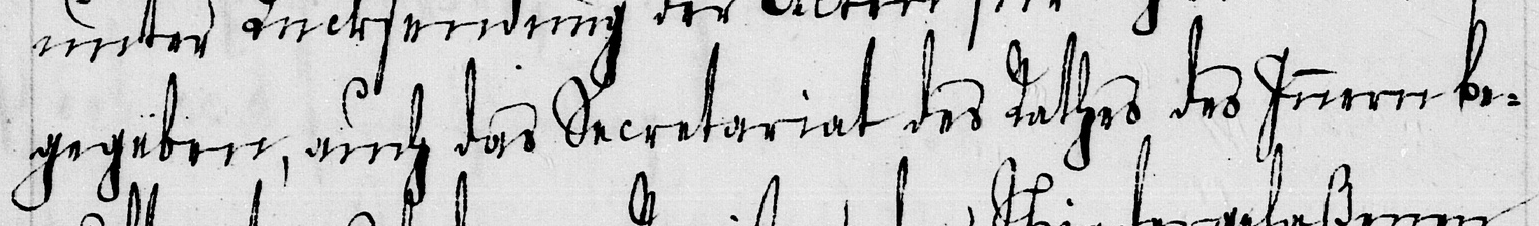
gegeben, auch das Secretariat des Rathes des Innern be¬
